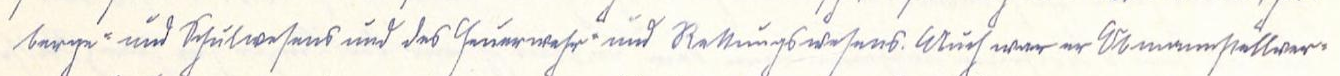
berge und Schulwesens und des Feuerwehr- und Rettungswesens. Auch war er Obmannstellver-
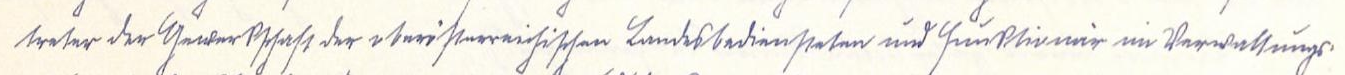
treter der Gewerkschaft der oberösterreichischen Landesbediensteten und Funktionär im Verwaltungs-
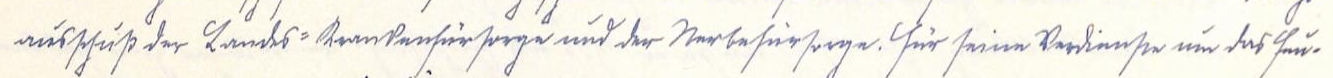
ausschuß der Landes - Krankenfürsorge und der Sterbefürsorge. Für seine Verdienste um das Feu-
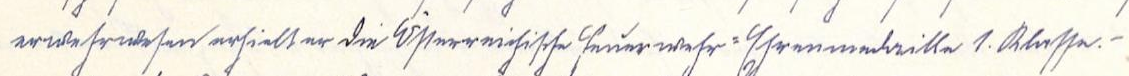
erwehrwesen erhielt er in die österreichische Feuerwehr - Ehrenmedaille 1. Klasse.
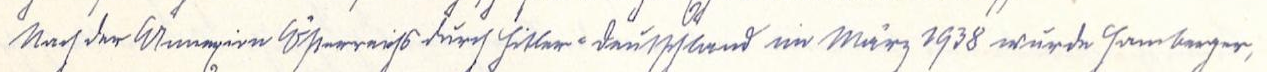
Nach der Annexion Österreichs durch Hitler - Deutschland im März 1938 wurde Hamberger,
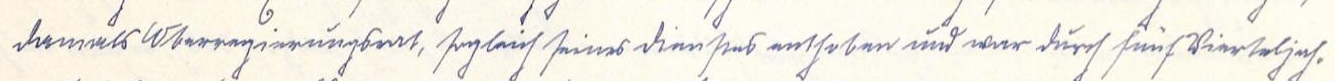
damals Oberregierungsrat, sogleich seines Dienstes enthoben und waren durch fünf Vierteljah-
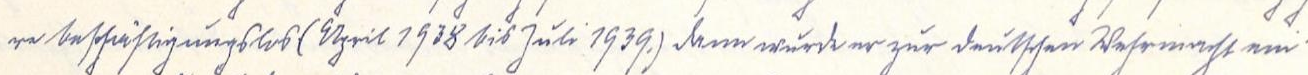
re beschäftigungslos (April 1938 bis Juli 1939) dann wurde er zur deutschen Wehrmacht ein-
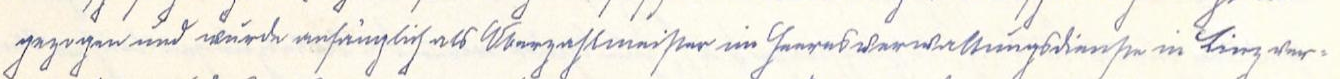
gezogen und wurde anfänglich alles Oberzahlmeister im Heeresverwaltungsdienste in Linz ver-
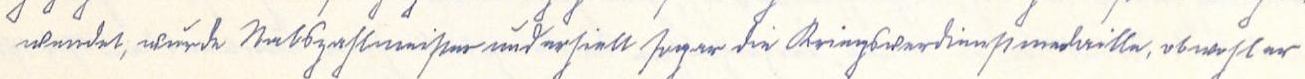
wendet, wurde dann Stabszahlmeister und erhielt sogar die Kriegsverdienstmedaille, obwohl er
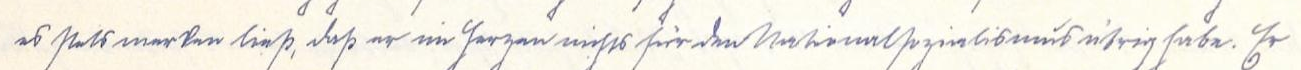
es stets merken ließ, daß er im Herzen nichts für den Nationalsozialismus übrig habe. Er
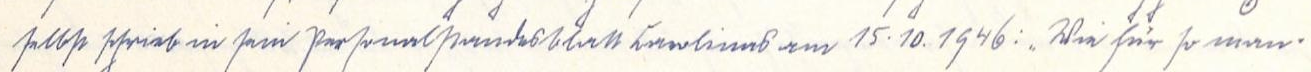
selbst schrieb in sein Personalstandesblatt Carolinas am 15. 10. 1946: „ Wie für so man-
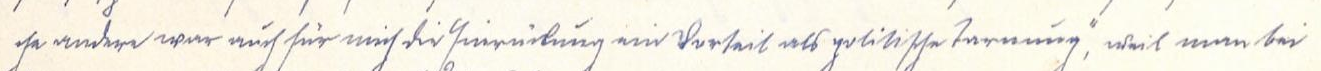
che andre war auch für mich die Einrückung ein Vorteil als politische Tarnung", weil man bei
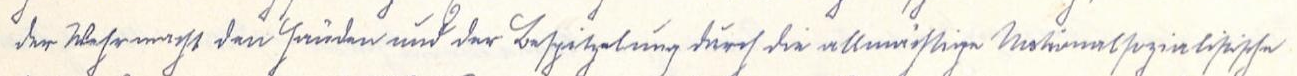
der Wehrmacht den Gauden und der Bespitzelung durch die allmächtige Nationalsozialistische
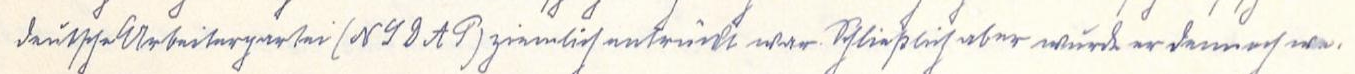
deutsche Arbeiterpartei (NSDAP) ziemlich entrückt war. Schließlich aber wurde er dennoch er-
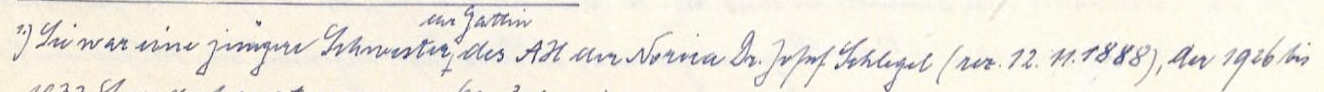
1) Sie war eine jüngere Schwester der Gattin des AH der Norica Dr. Joseph Schlegel (rez. 12. 11. 1888), der 1926 bis
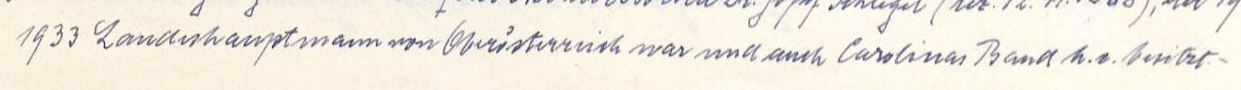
1933 Landeshauptmann von Oberösterreich war und auch Carolinas Band h.c. besitzt.
